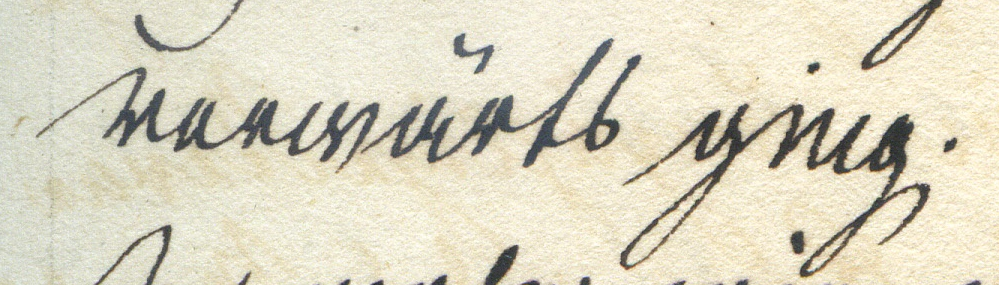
vorwärts ging.
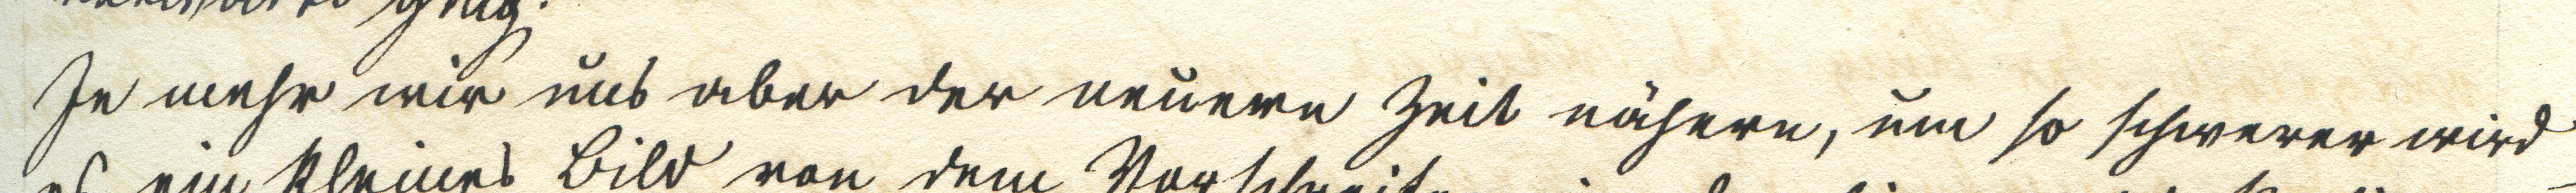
Je mehr wir uns aber der neuern Zeit nähern, um so schwerer wird
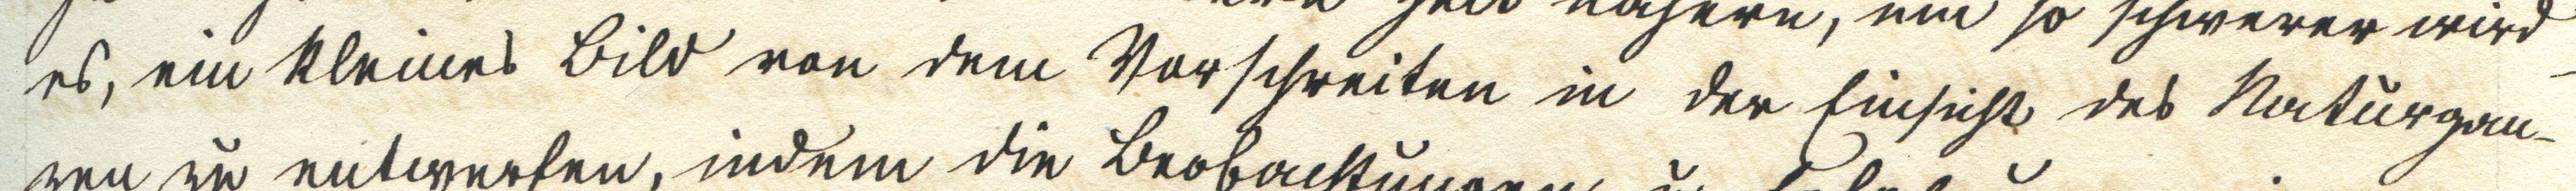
es, ein kleines Bild von dem Vorschreiten in der Einsicht des Naturgan-
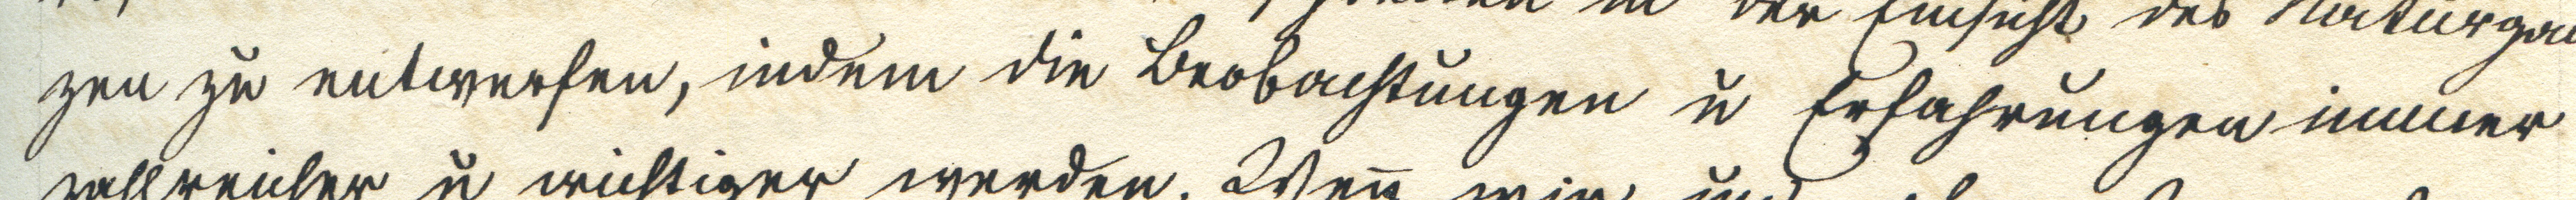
zen zu entwerfen, indem die Beobachtungen u Erfahrungen immer
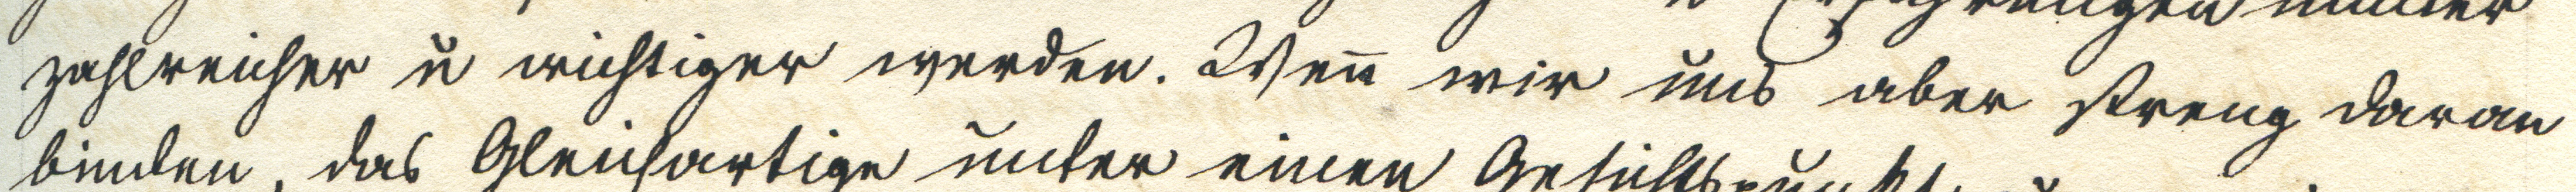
zahlreicher u wichtiger werden. Weñ wir uns aber streng daran
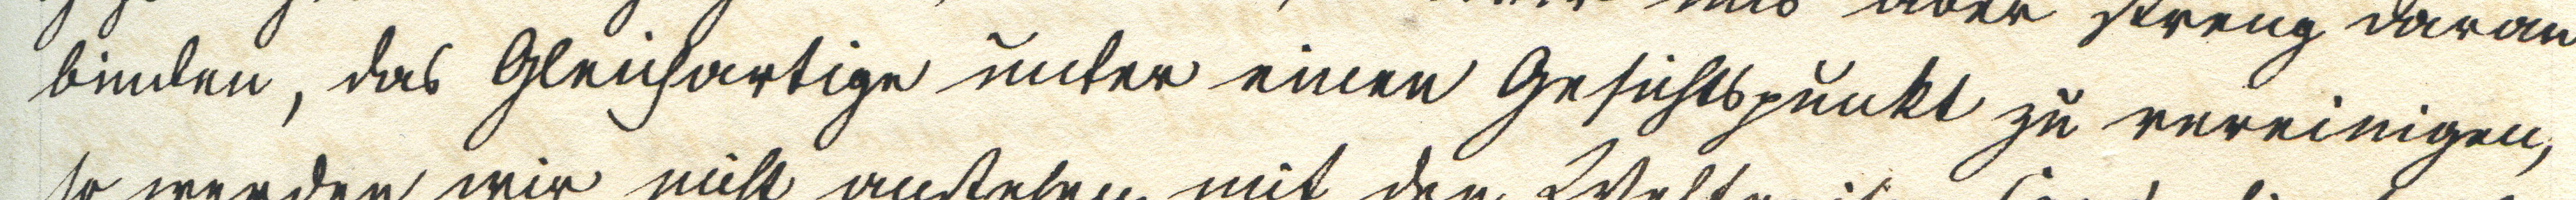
binden, das Gleichartige unter einen Gesichtspunkt zu vereinigen,
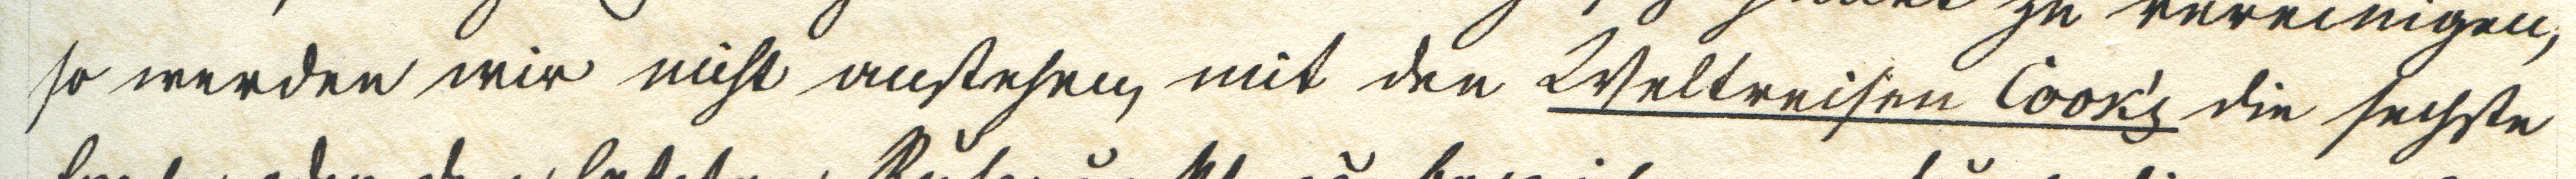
so werden wir nicht anstehen, mit den Weltreisen Cook’s die sechste
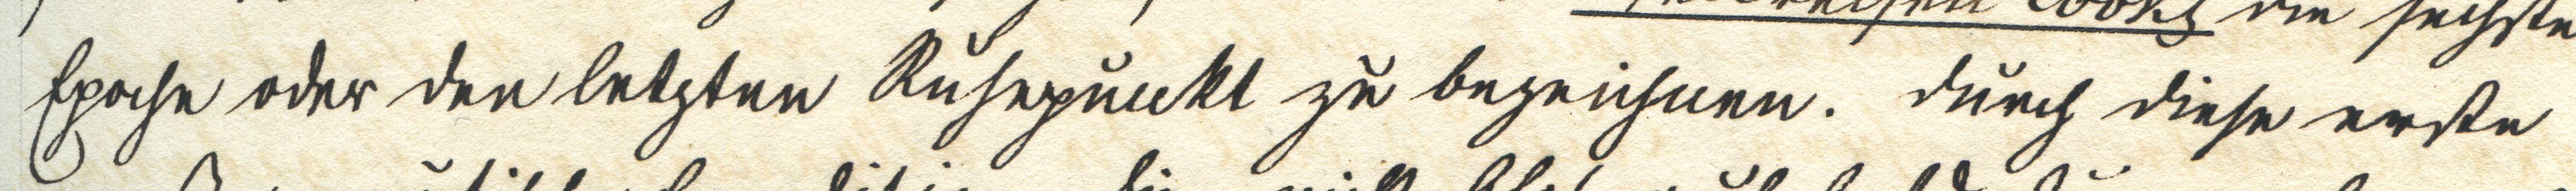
Epoche oder den letzten Ruhepunkt zu bezeichnen. Durch diese erste
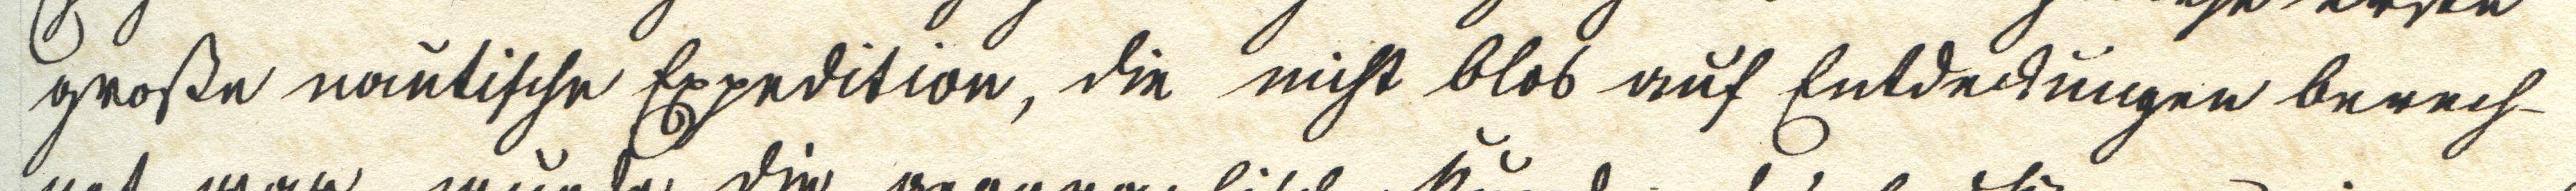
große nautische Expedition, die nicht blos auf Entdeckungen berech-
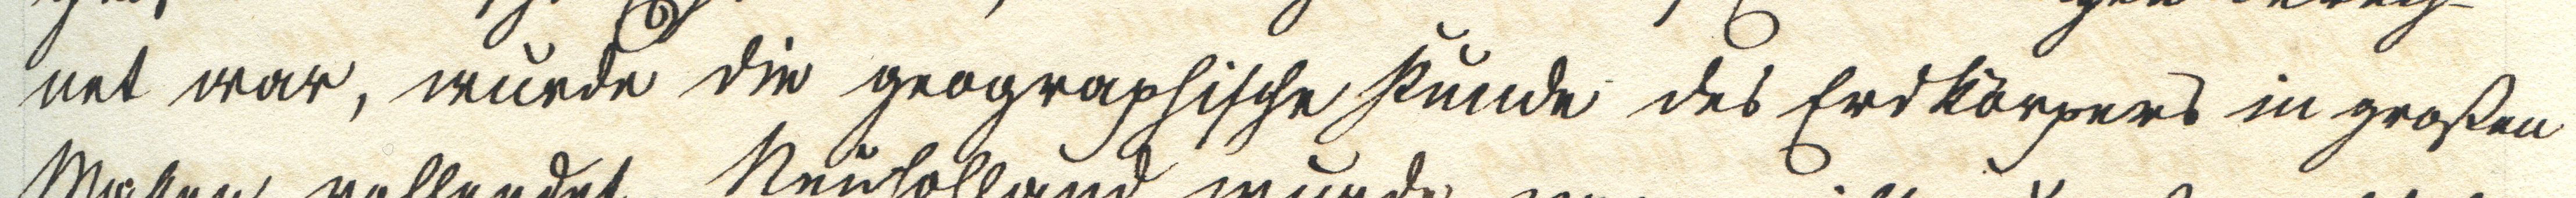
net war, wurde die geographische Kunde des Erdkörpers in großen
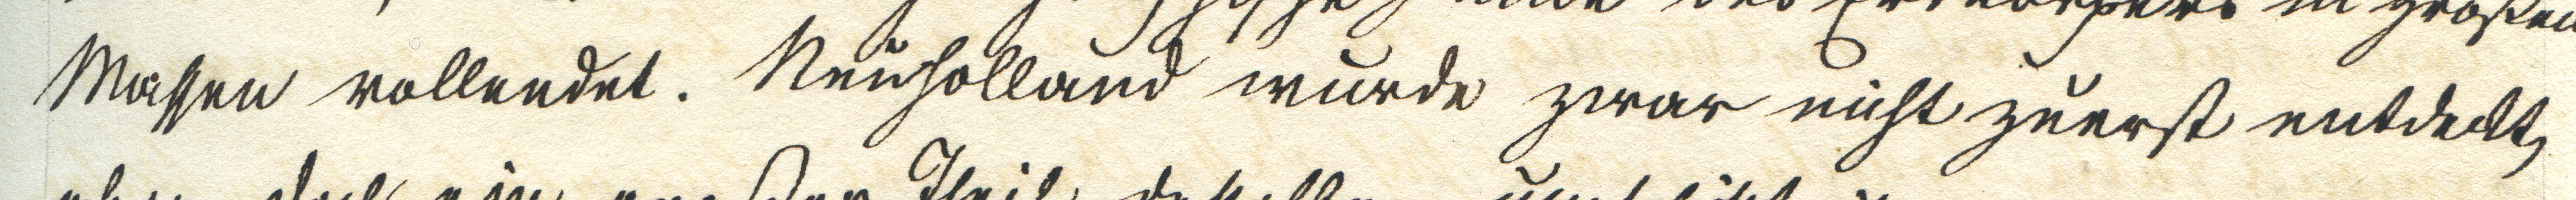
Massen vollendet. Neuholland wurde zwar nicht zuerst entdeckt,
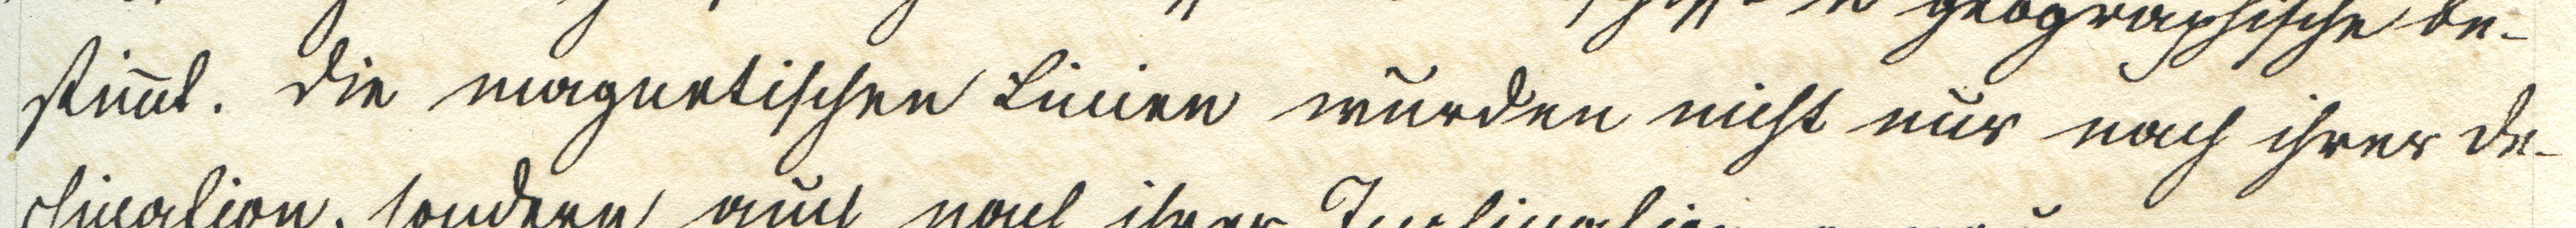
stim̃t. Die magnetischen Linien wurden nicht nur nach ihrer De-
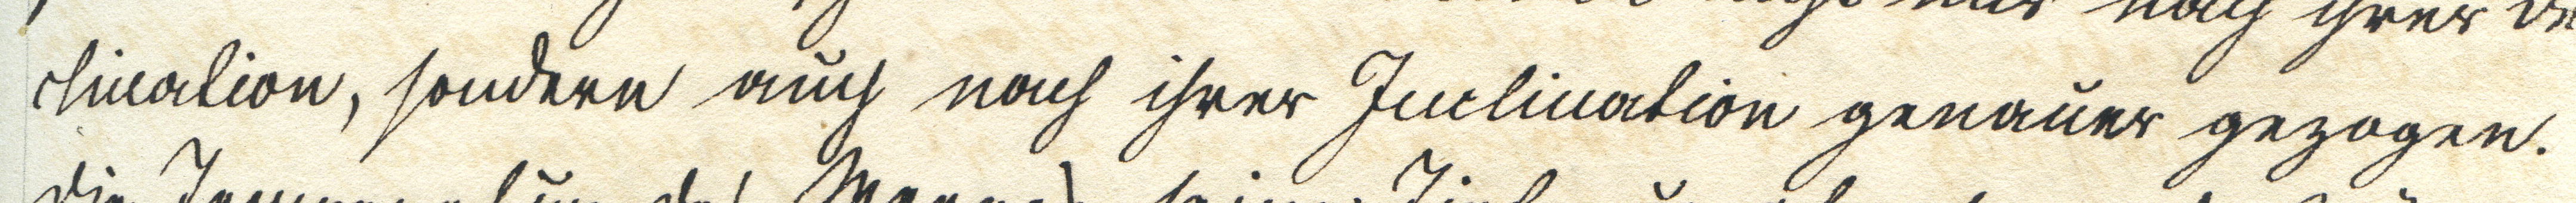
clination, sondern auch nach ihrer Inclination genauer gezogen.
